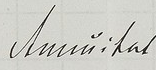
Annuität
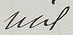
nicht
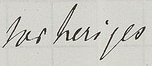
Verständniss
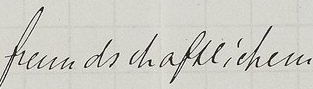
freundschaftlichem
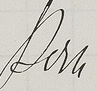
Welti
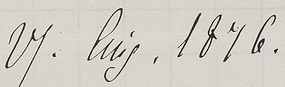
27. Aug. 1876.
